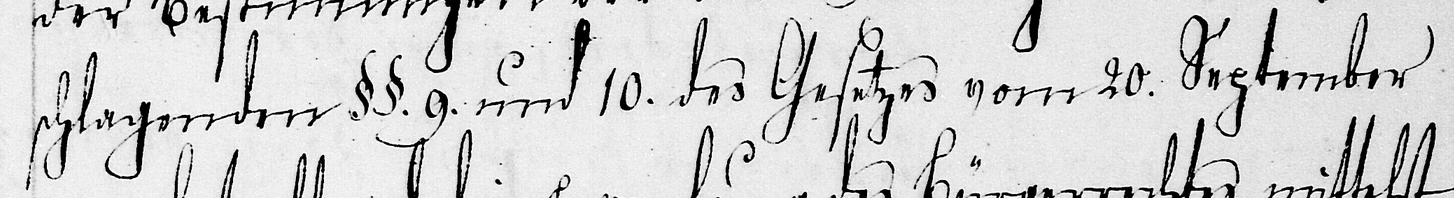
schlagenden §§. 9. und 10. des Gesetzes vom 20. September
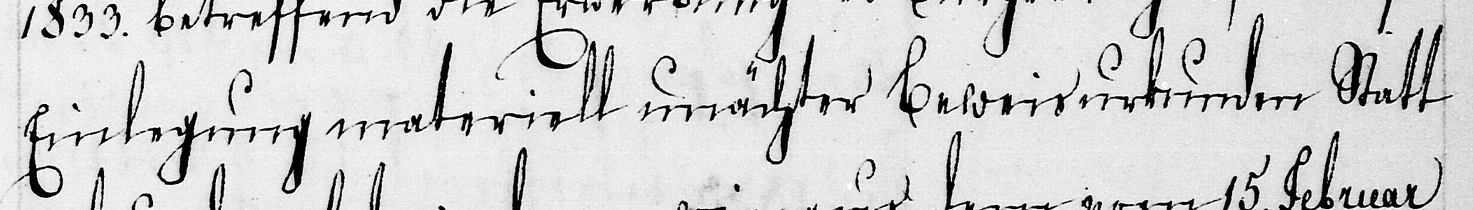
Einlegung materiell unächter Beweisurkunden Statt
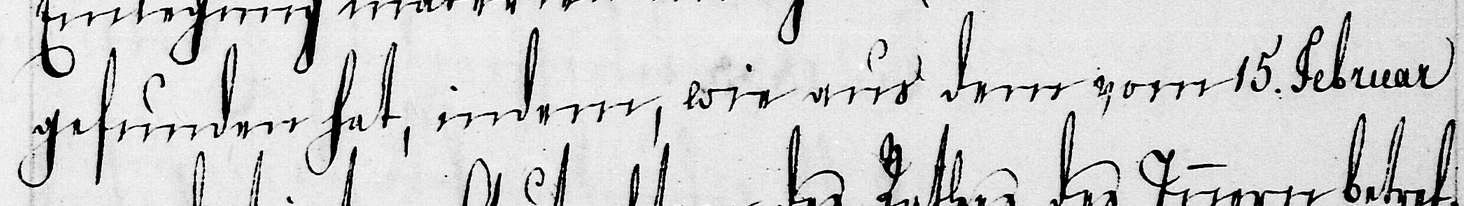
gefunden hat, indem, wie aus dem vom 15. Februar
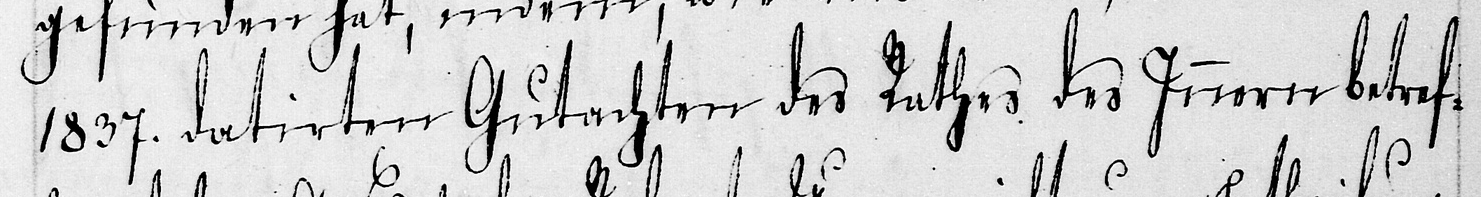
1837. datirten Gutachten des Rathes des Innern betref¬
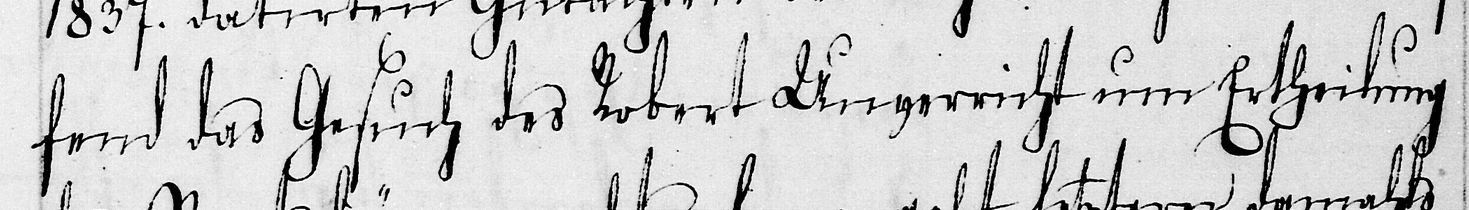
fend das Gesuch des Robert Unverricht um Ertheilung
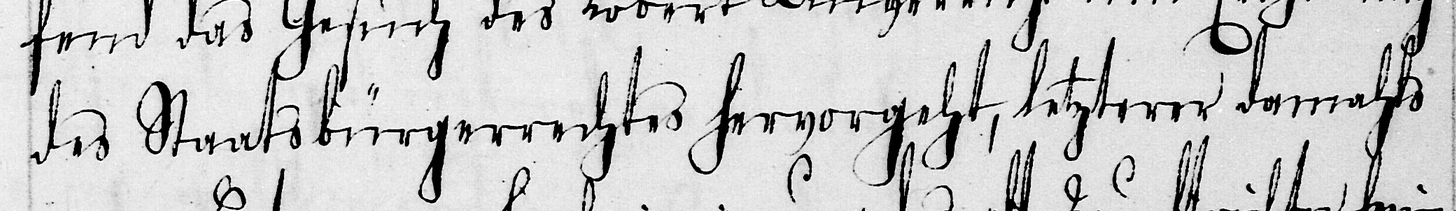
des Staatsbürgerrechtes hervorgeht, letzterer damahls
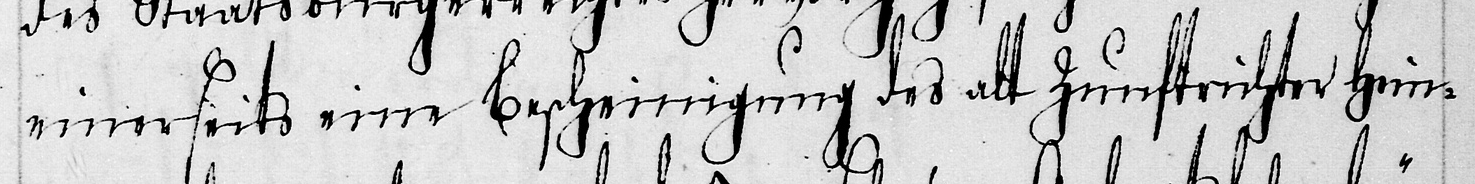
einerseits eine Bescheinigung des alt Zunftrichter Hein¬
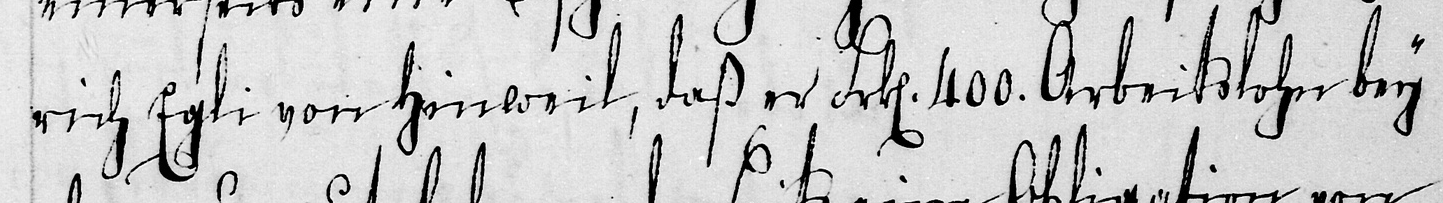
rich Egli von Hinweil, daß er Frk[en]. 400. Arbeitslohn bey
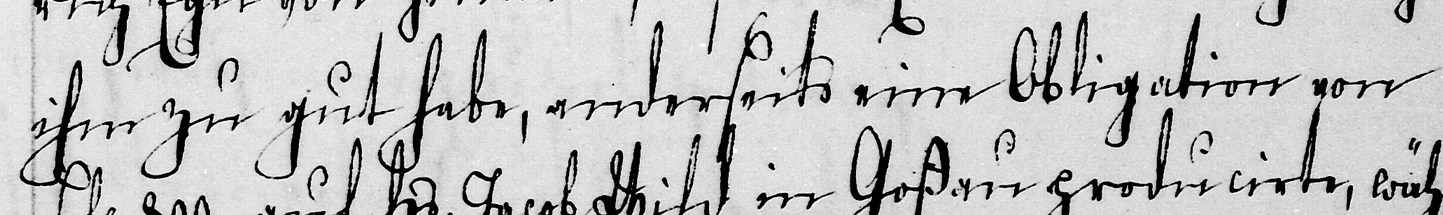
ihm zu gut habe, anderseits eine Obligation von
